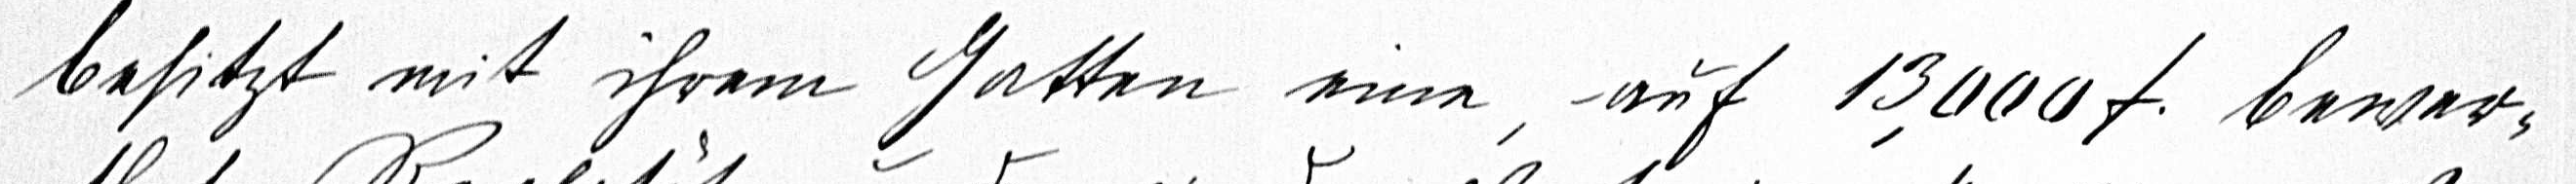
besitzt mit ihrem Gatten eine, auf 13,000f brewer¬
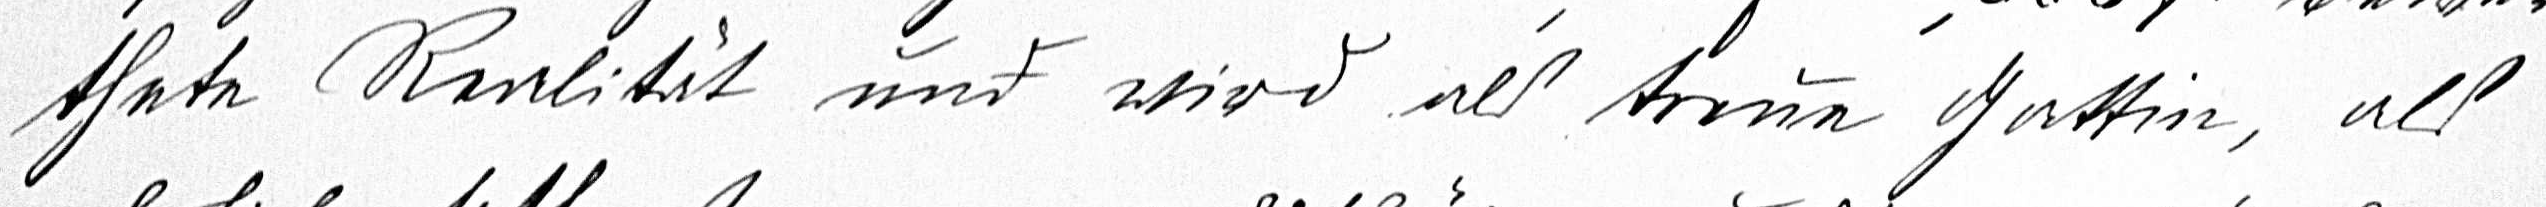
thete Realität und wird als treue Gattin, als
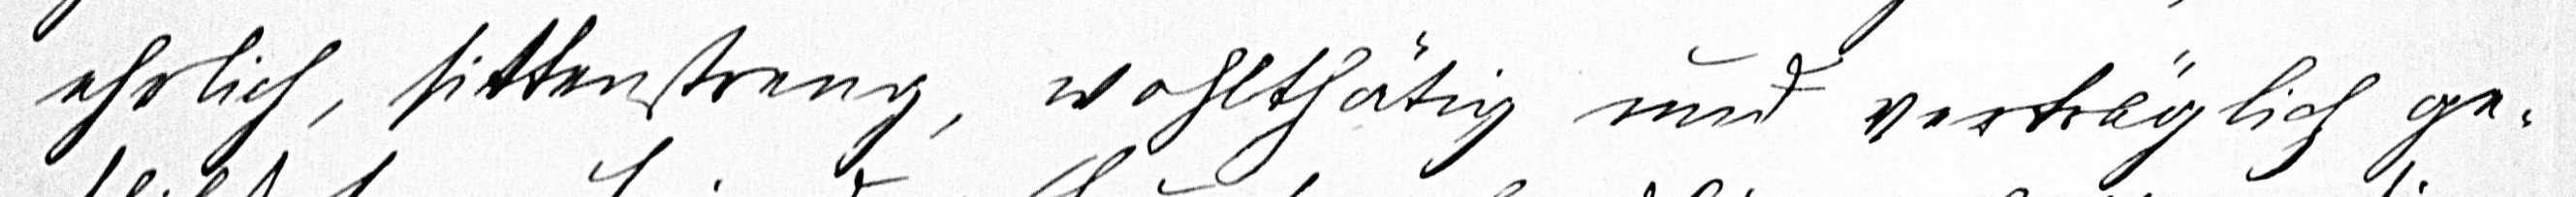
ehrlich, sittenstreng, wohlthätig und verträglich ge¬
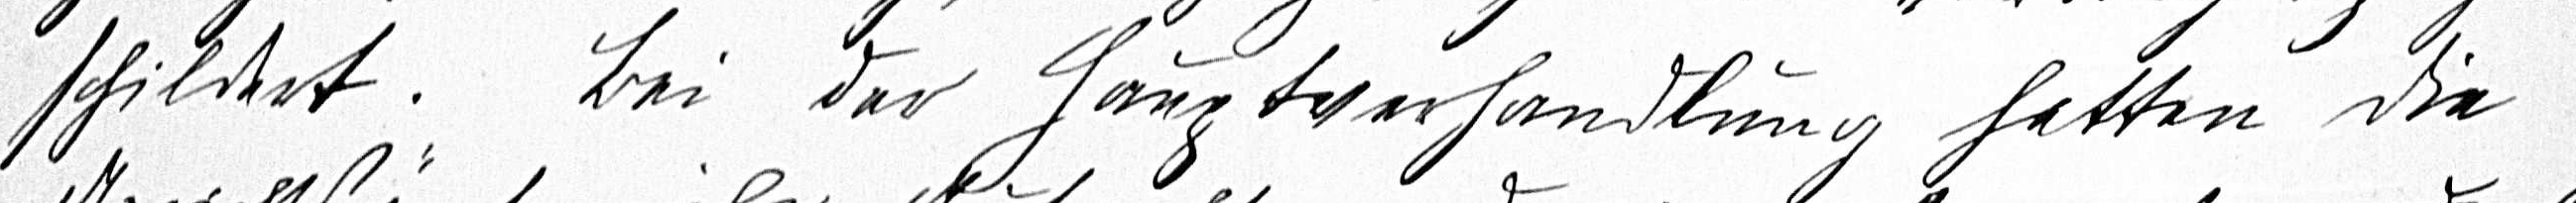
schildert. Bei der Hauptverhandlung hatten die
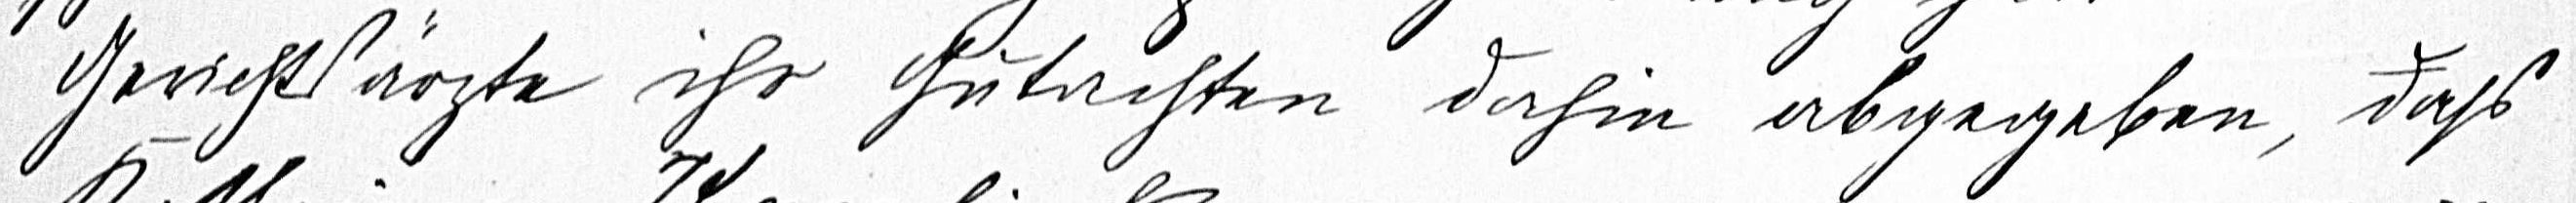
Gerichtsärzte ihr Gutachten dahin abgegeben, daß
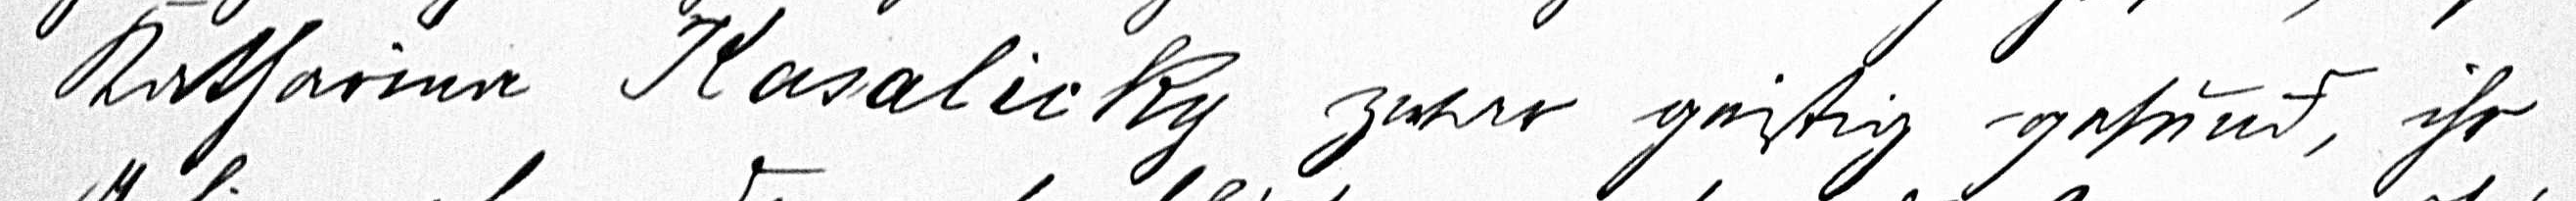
Katharina Kasalicky zwar geistig gesund, ihr
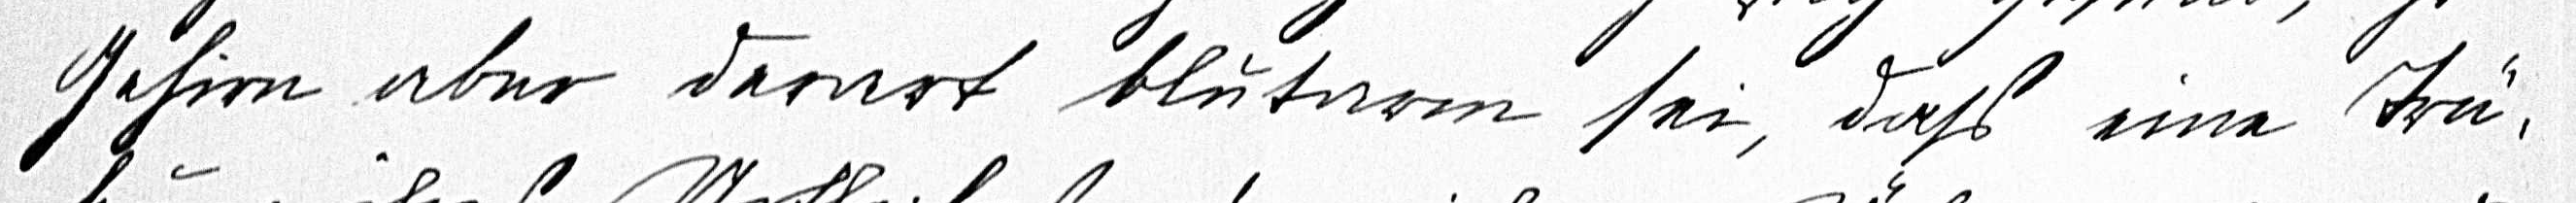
Gehirn aber derart blutarm sei, daß eine Trü¬
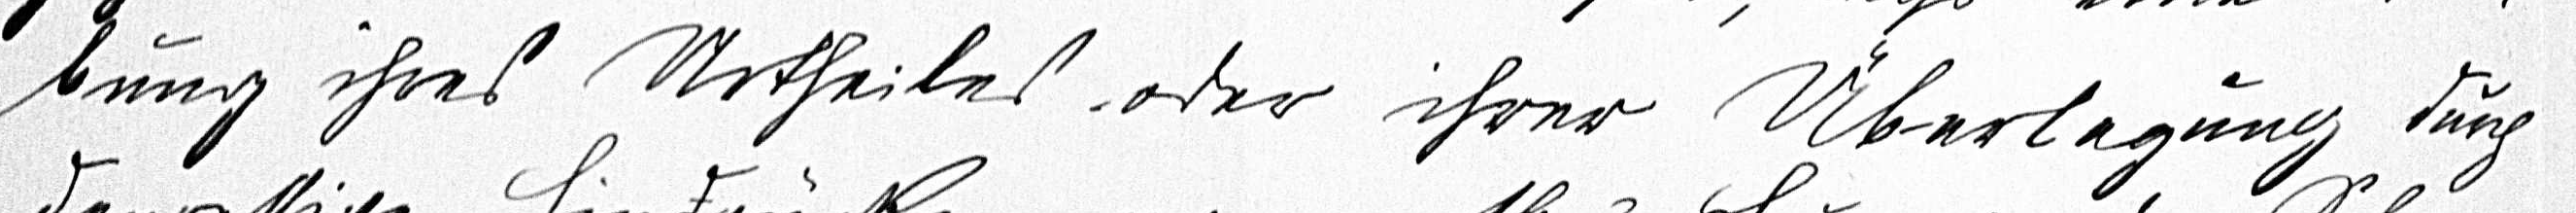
bung ihres Urtheiles oder ihrer Überlegung durch
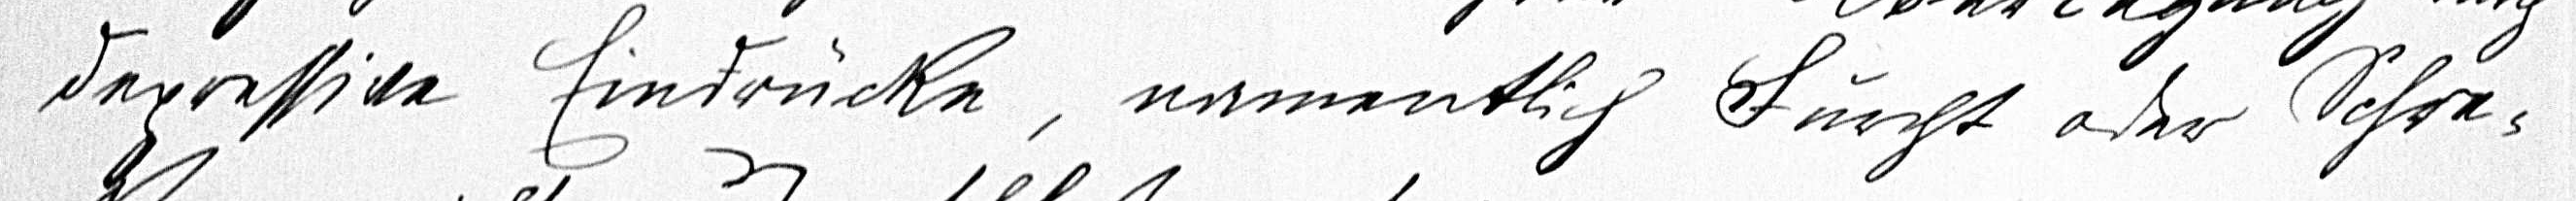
depressive Eindrücke, namentlich Furcht oder Schre¬
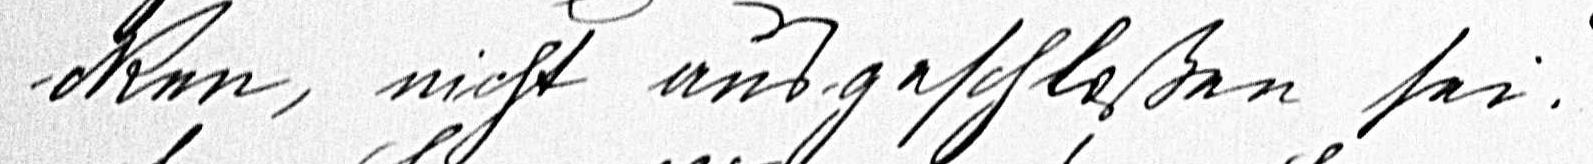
cken, nicht ausgeschloßen sei.
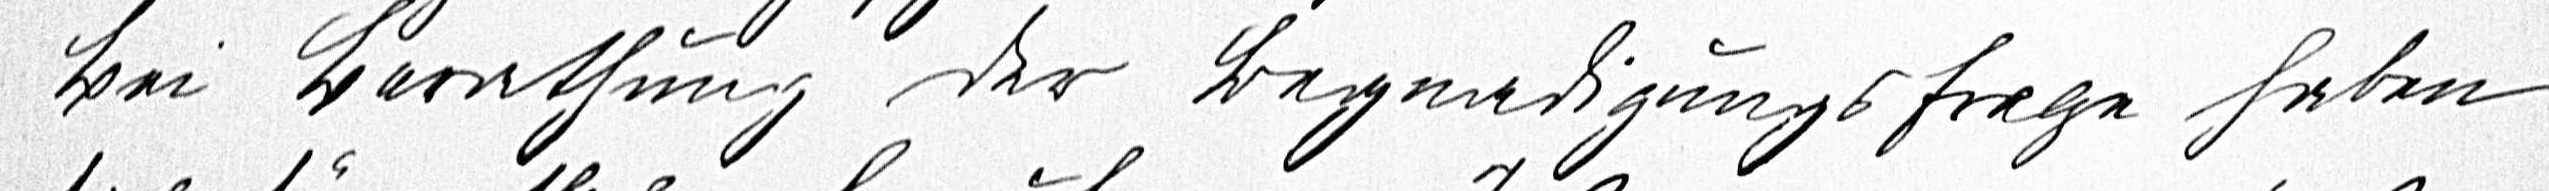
Bei Berathung der Benadigungsfrage haben
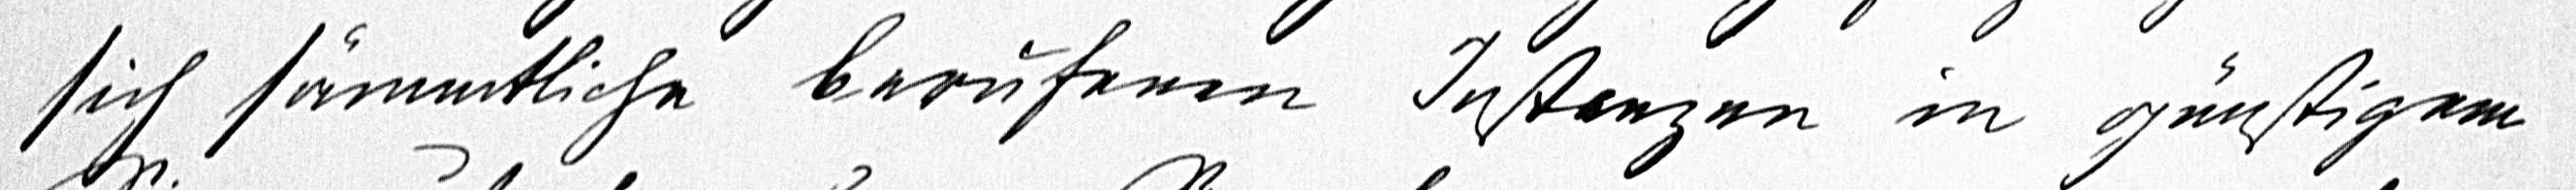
sich sämmtliche berufenen Instanzen in günstigem
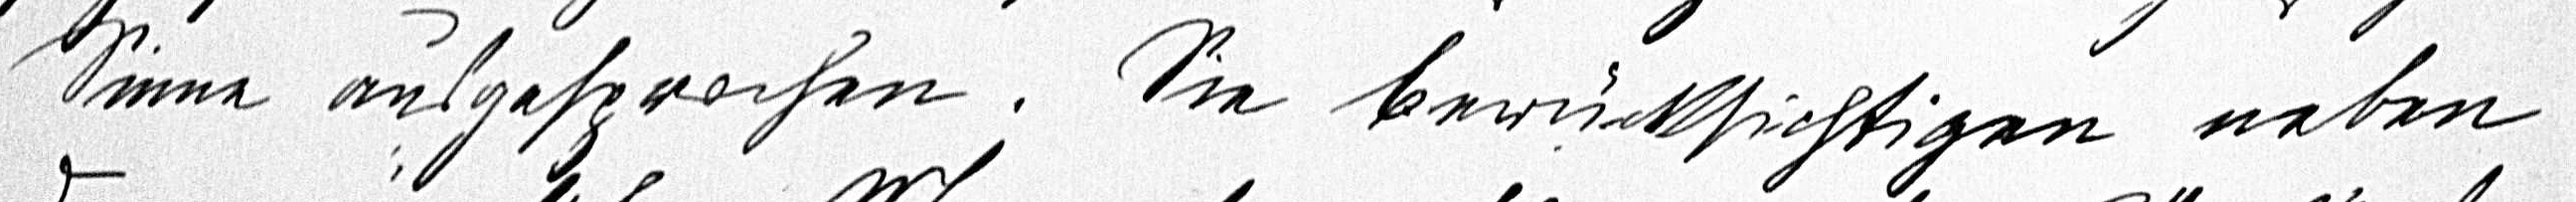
Sinne ausgesprochen. Sie berücksichtigen neben
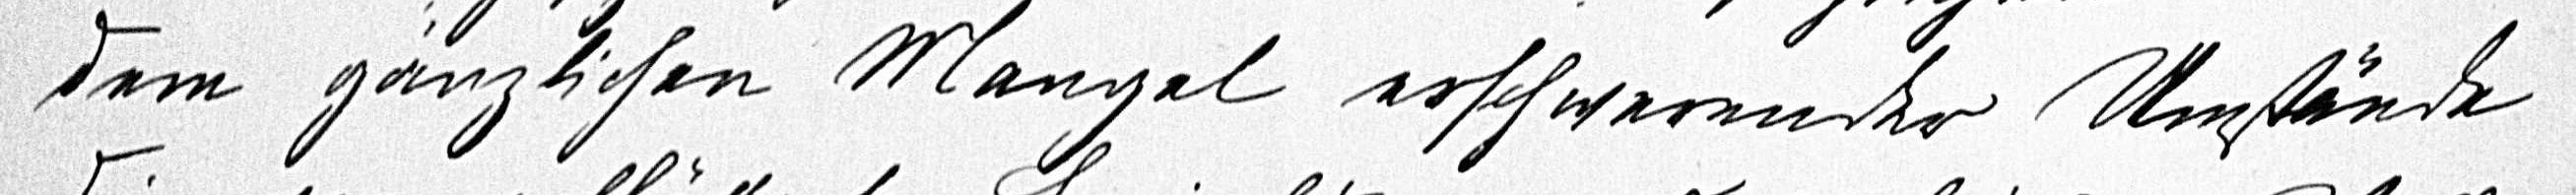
dem gänzlichen Mangel erschwerender Umstände
